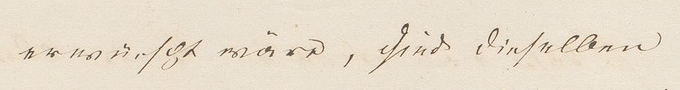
erwünscht wäre, sind dieselben
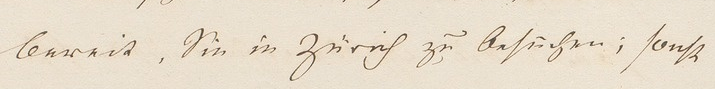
bereit, Sie in Zürich zu besuchen; sonst
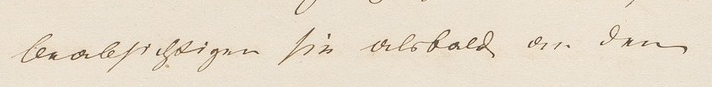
beabsichtigen sie alsbald an den
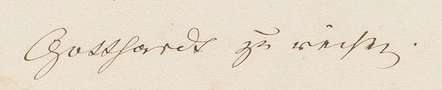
Gotthardt zu reisen. –
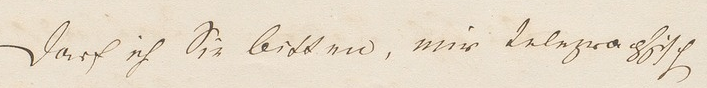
Darf ich Sie bitten, mir telegraphisch
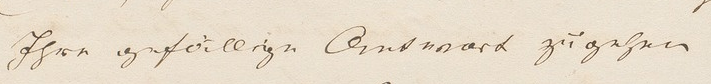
Ihre gefällige Antwort zu geben
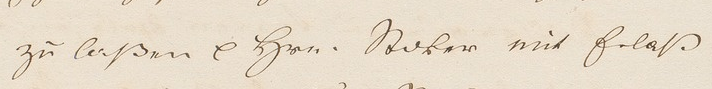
zu laßen & Hrn. Stokar mit Erlaß
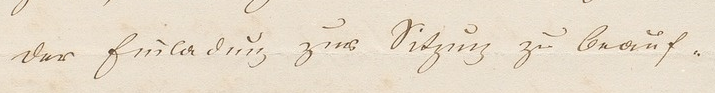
der Einladung zur Sitzung zu beauf-
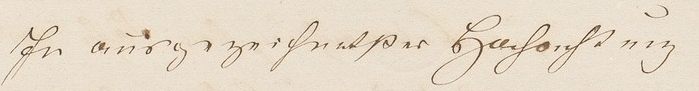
In ausgezeichnetster Hochachtung
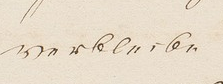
verbleibe
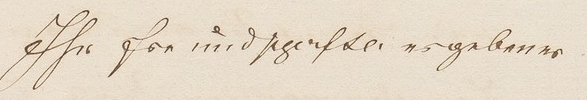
Ihr freundschaftl. ergebener
